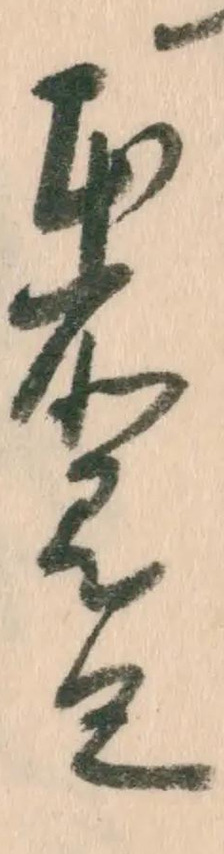│本所見廻
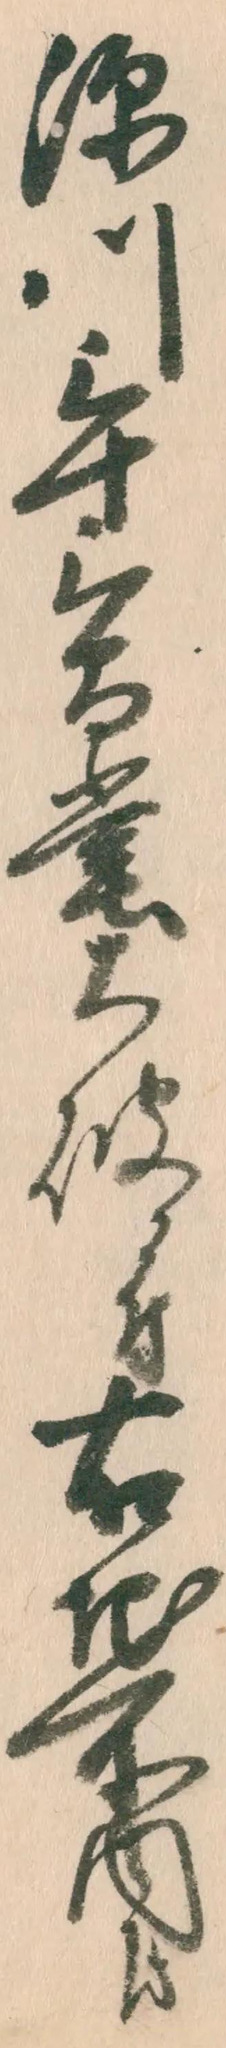深川三十三間堂大破に付右地所内え
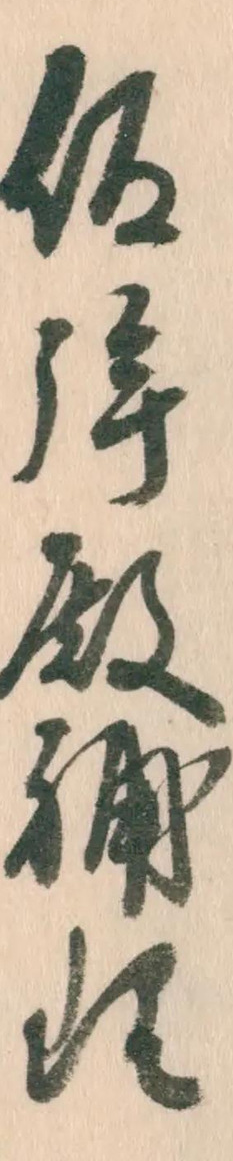仮拜殿補理
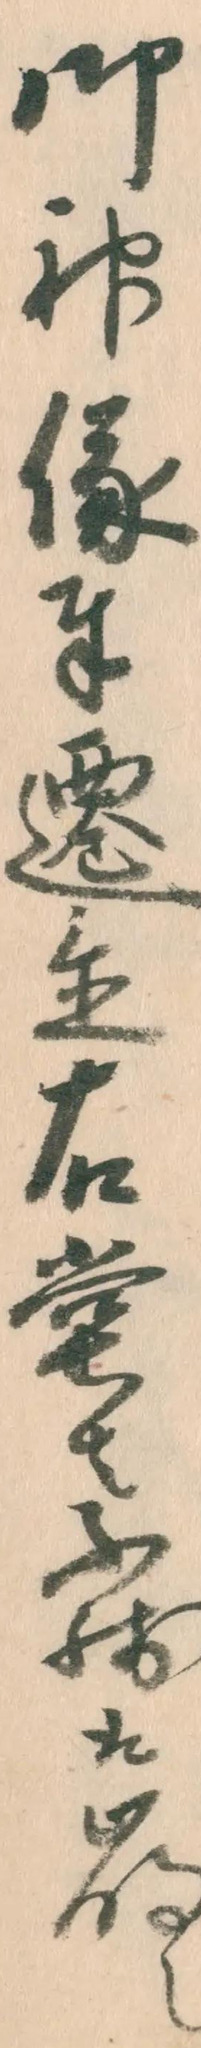御神像奉遷置右堂は不残取崩し

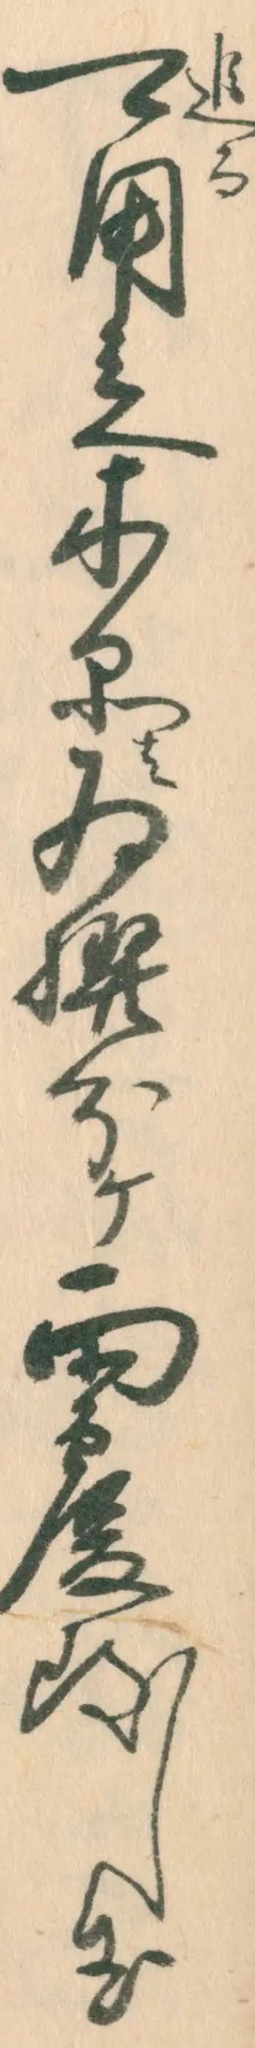可用立木品は為撰分け雨覆致し置
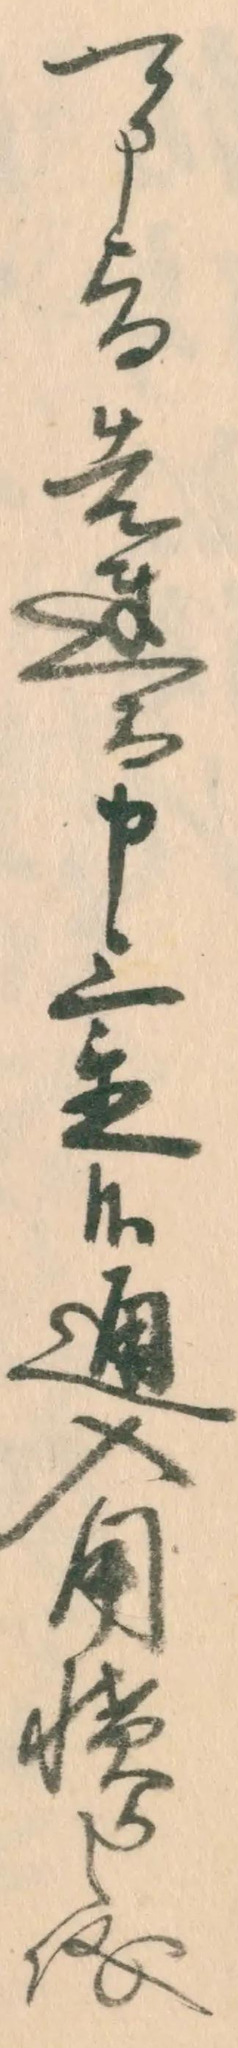可申旨先達而申上置候通入用積り之儀
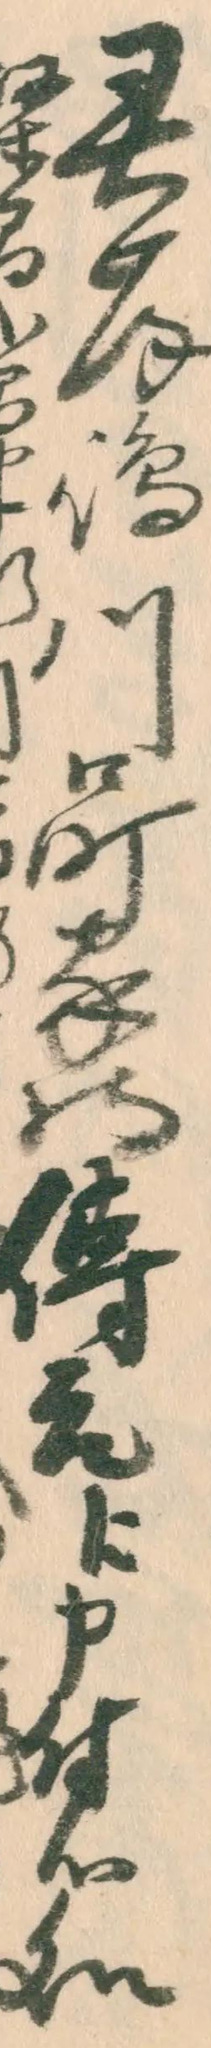霊岸嶋川口町家持伝吉え申付候処
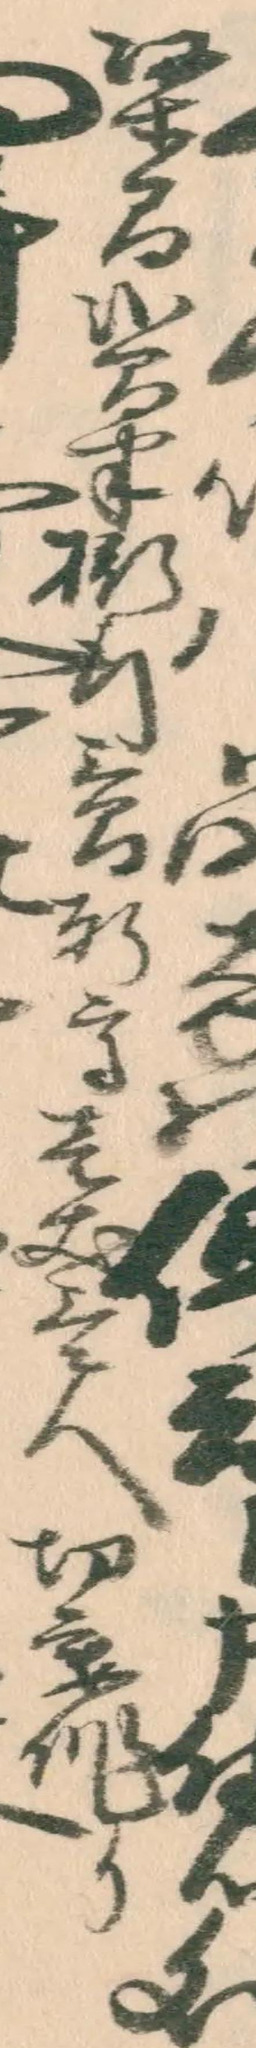梁間弐間半桁行三間軒高壱丈三尺切妻作り
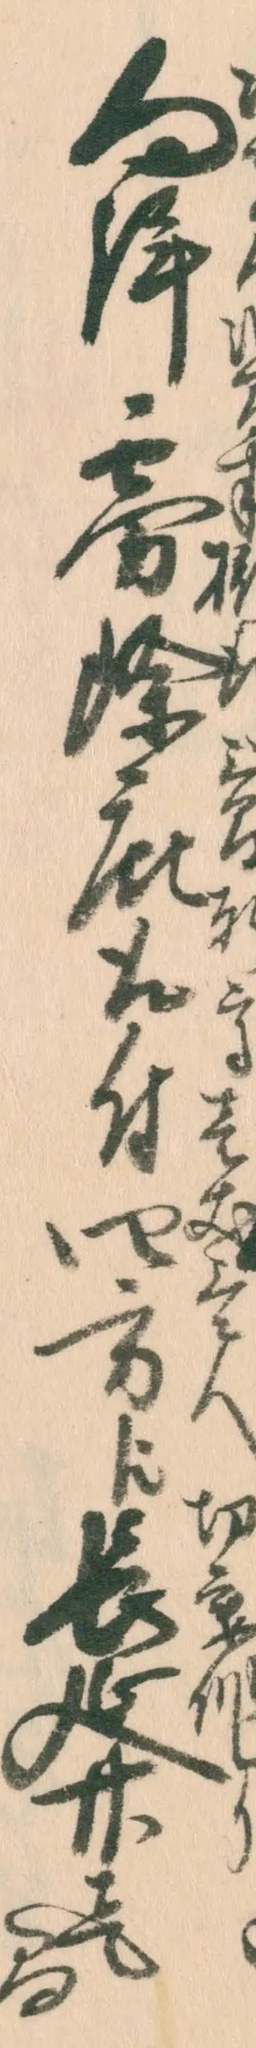向拝霧除庇取付四方え長延廿壱間
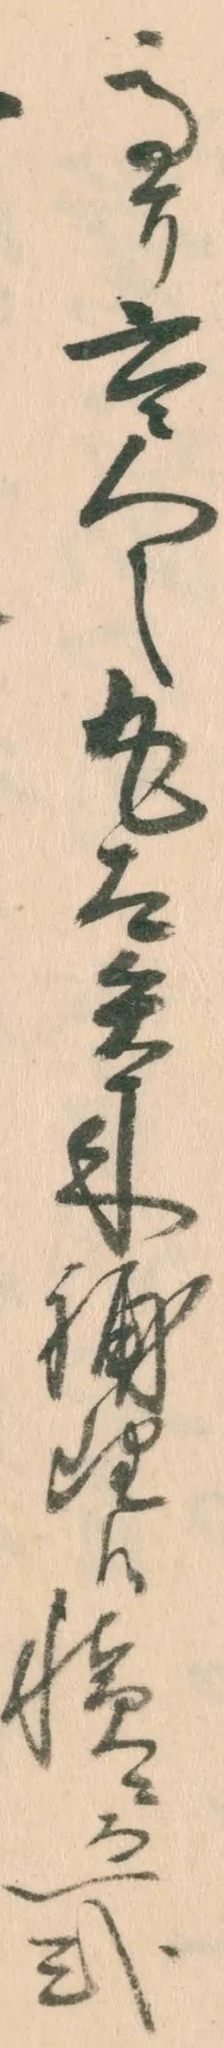高サ六尺之丸太矢来補理候積に而一式
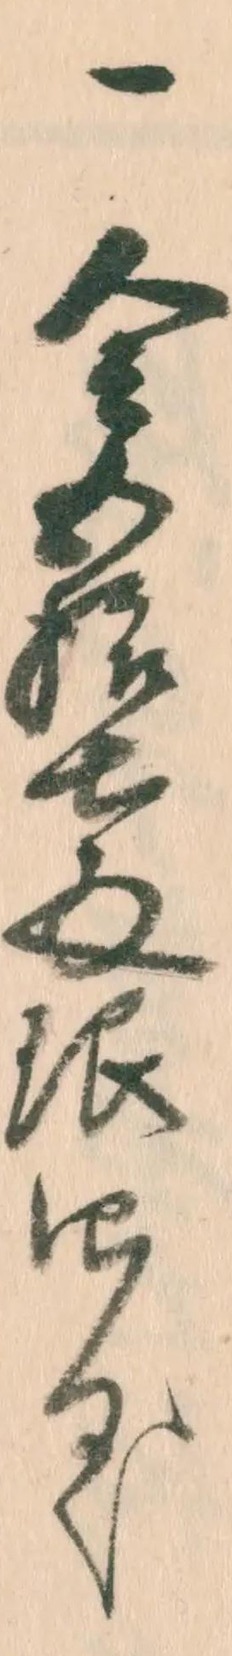一金五拾七両銀四匁
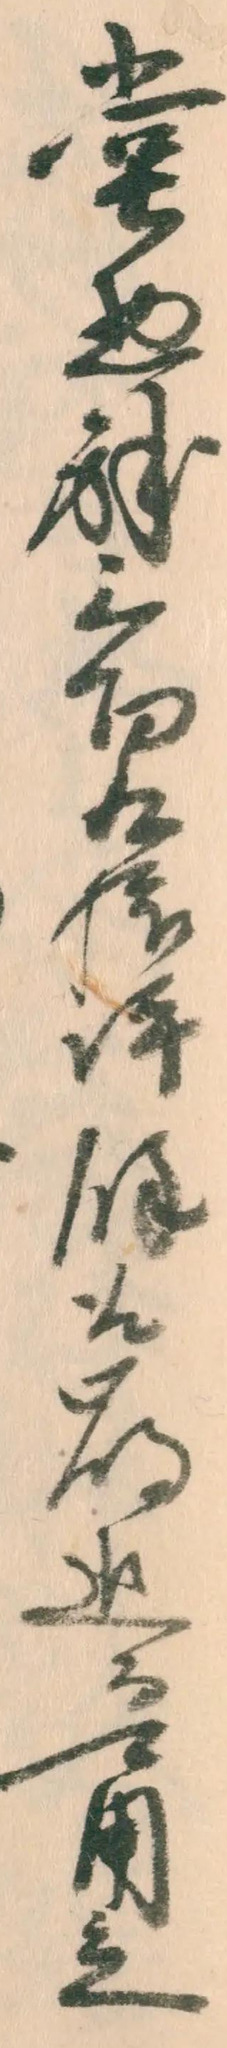堂惣体三百九拾坪余取崩追て可用立
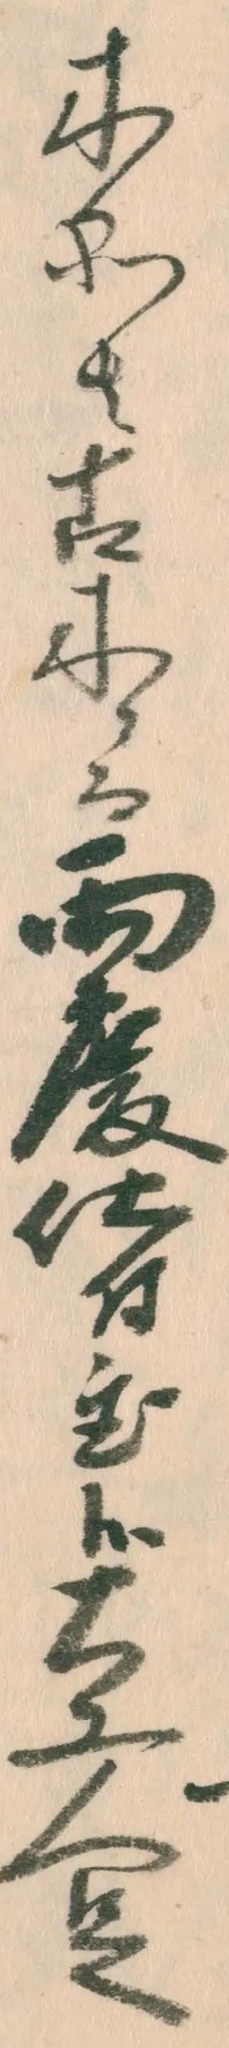木品は古木に而雨覆仕付置候大工人足
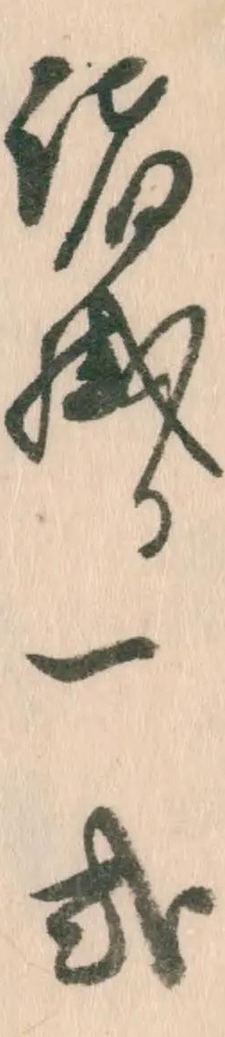諸掛り一式
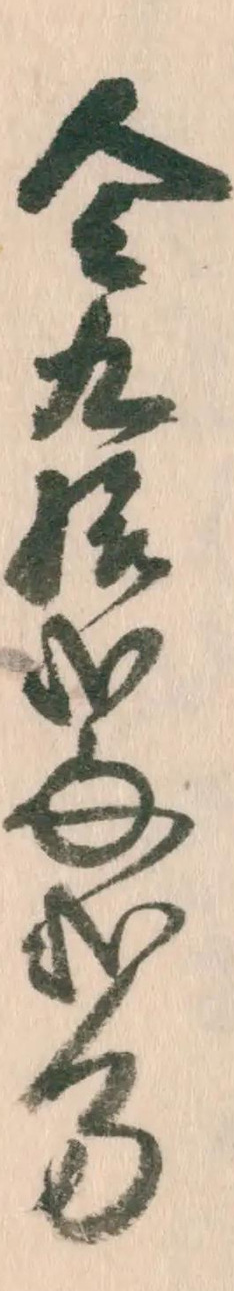一金九拾弐両弐分
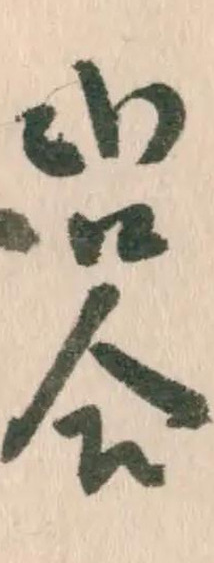弐口合
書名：三十三間堂. [1]
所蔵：国立国会図書館 National Diet Library, JAPAN
